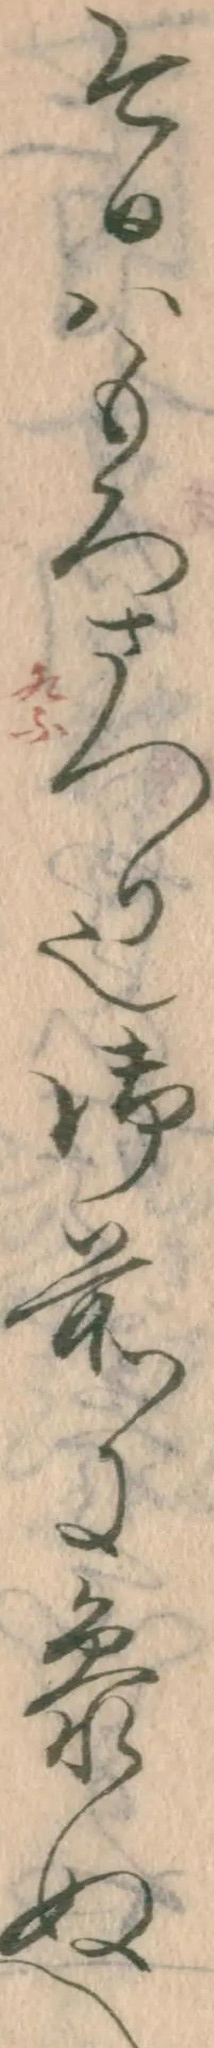今日はもろまつり也御前に参ぬ
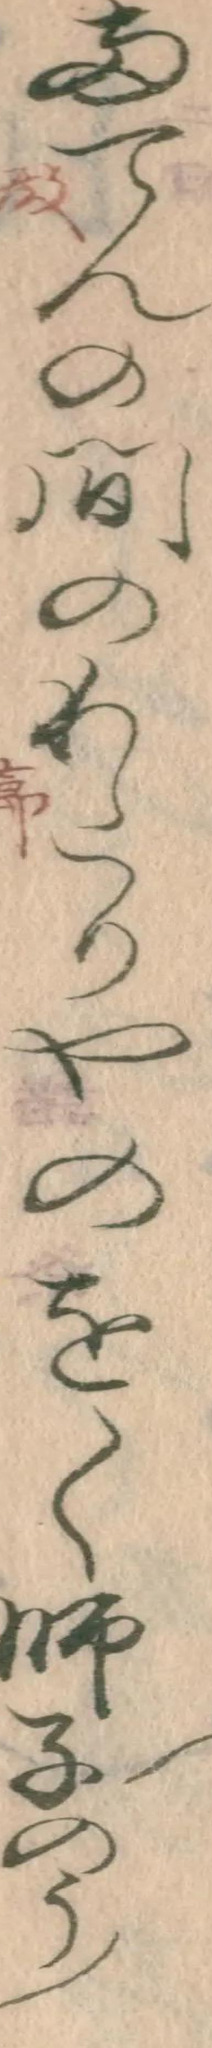両てんの間のわたりやのをく師子のう
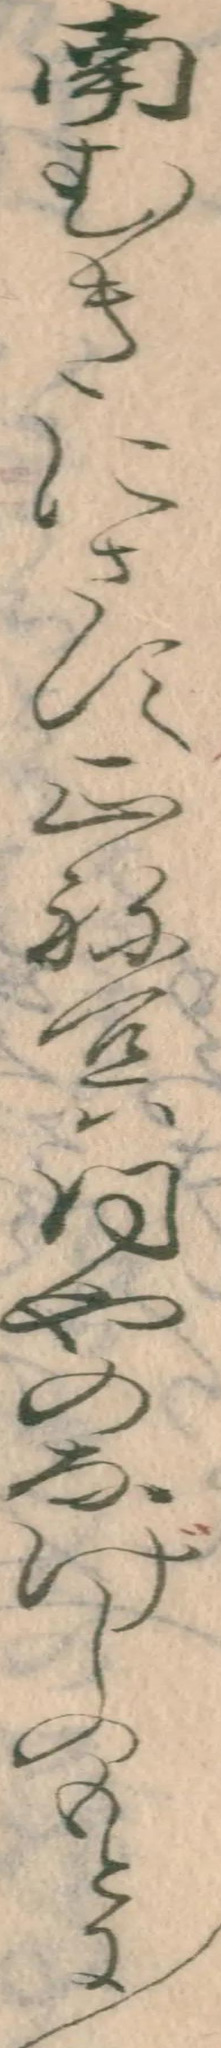南むきにさす正祢宜は同やのなげしのもとに
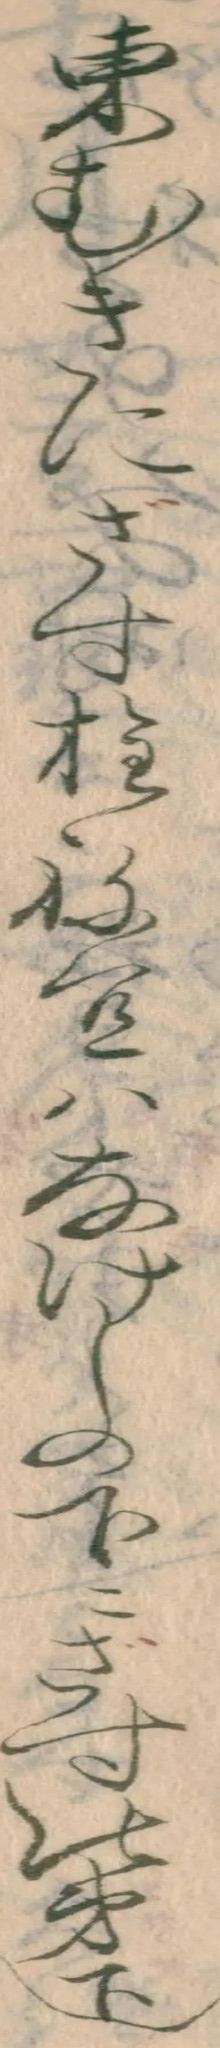東むきにざす権祢宜はなけしの下にざす此第下
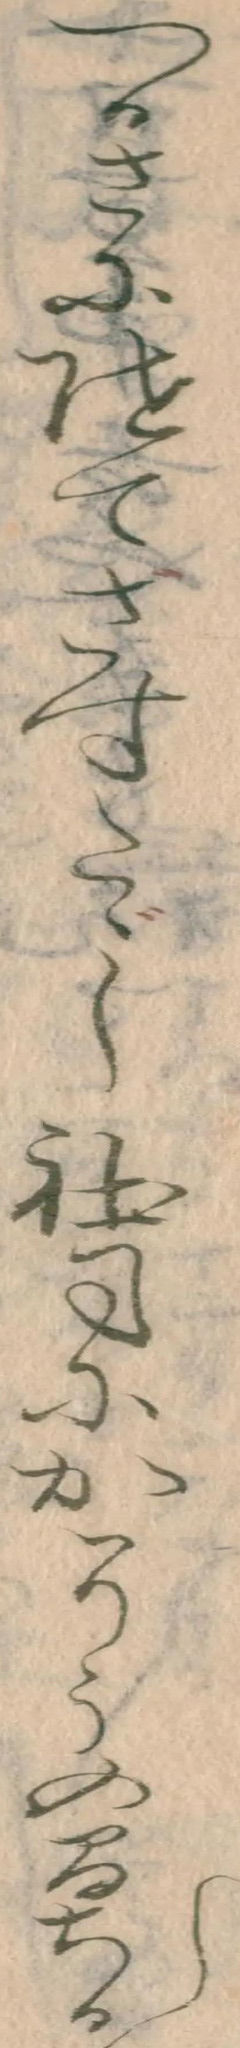つかさに随てざすたゞし社司にかそうの間ちる
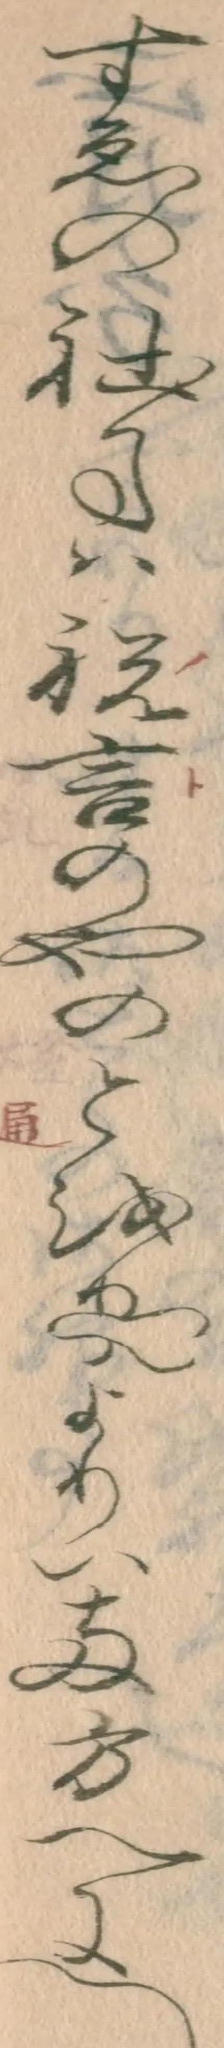すゑの社司は祝言のやのとをりよりは両方へに
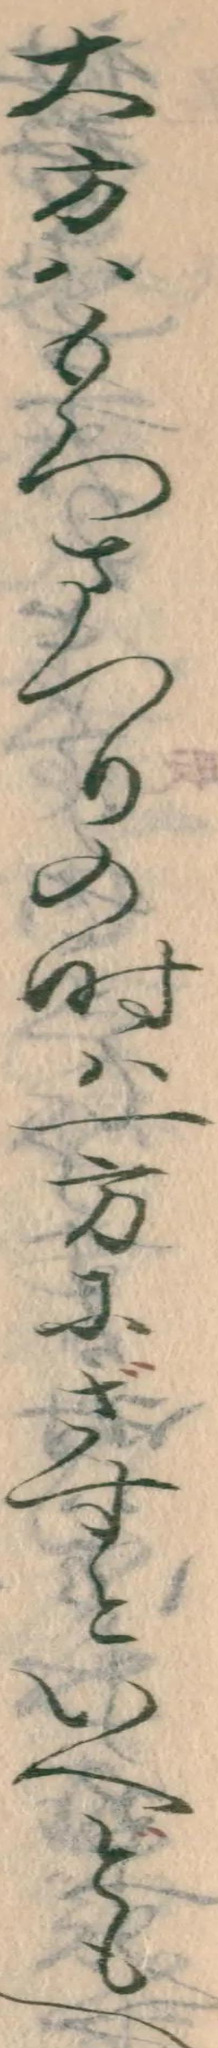大方はもろまつりの時は一方にざすといへども
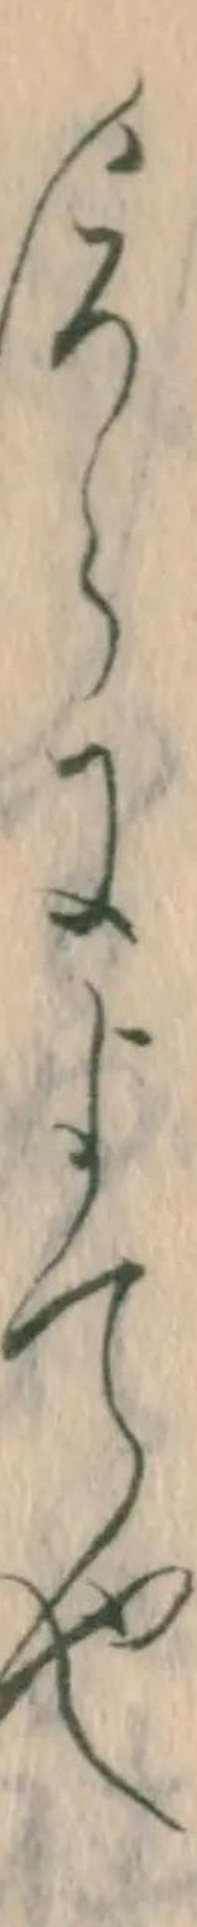ころによて也
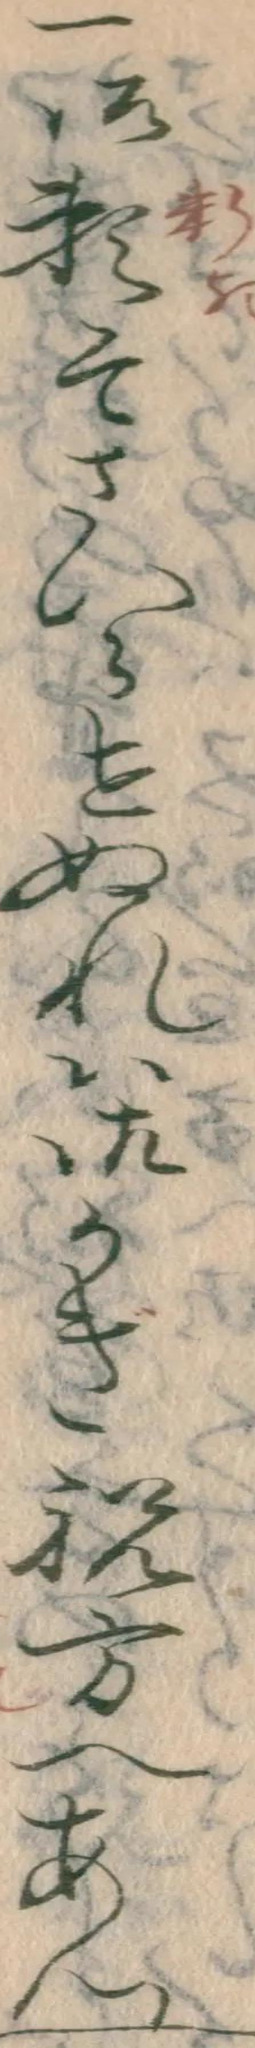一御頼そまいらせぬれは御かぎ祝方へあつ
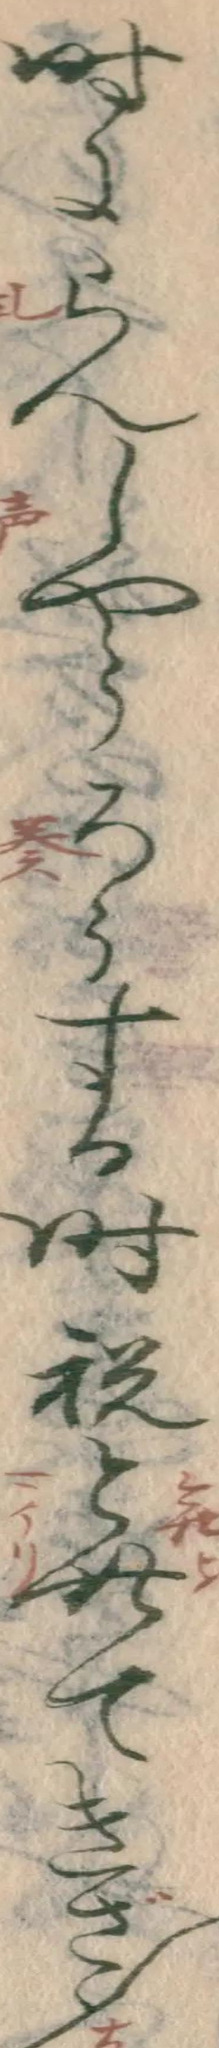時にらんしやうそうする時祝てきざはし歟
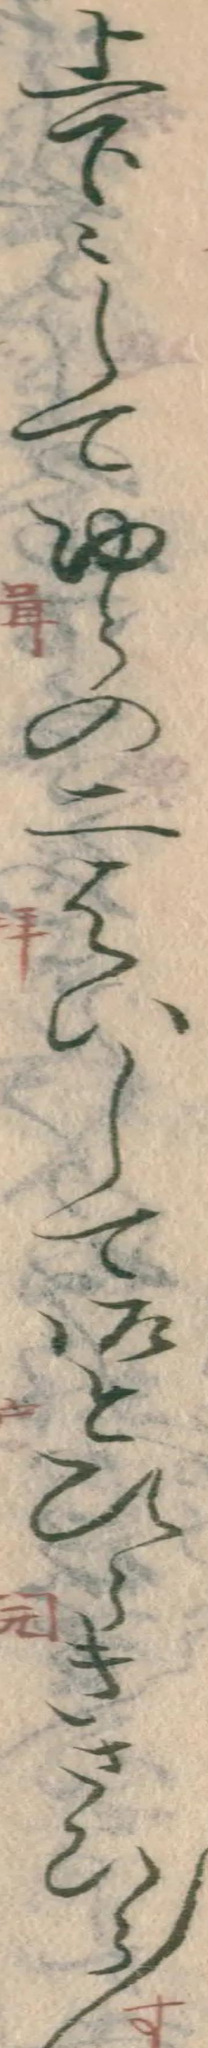上下にしてゆうの二はいして御とひらきまいらす
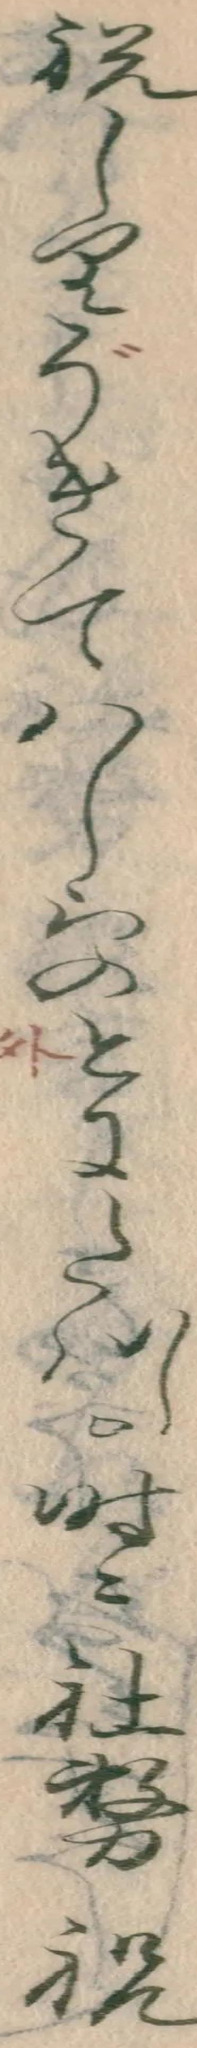祝しりぞきてはしらのとにたつ時々社務祝
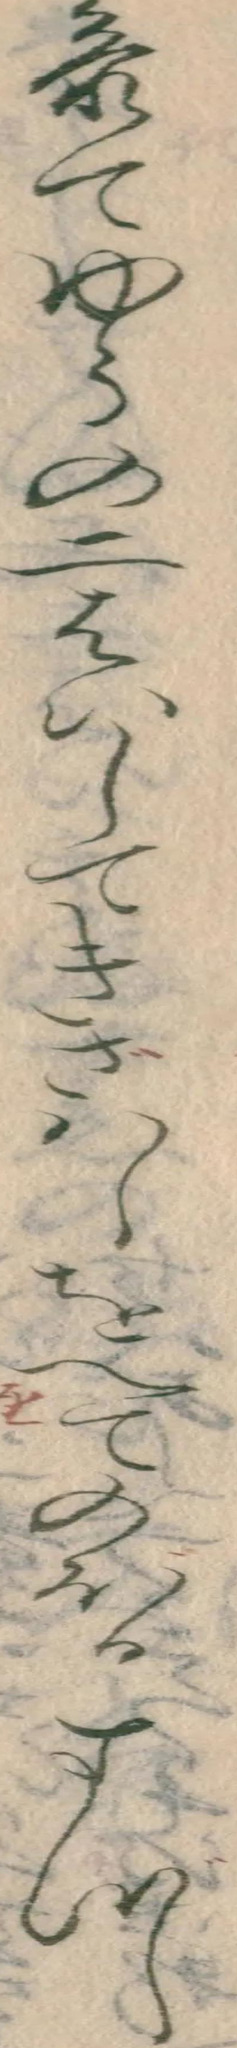参てゆうの二はいしてきざはしをへてのぼるすづし
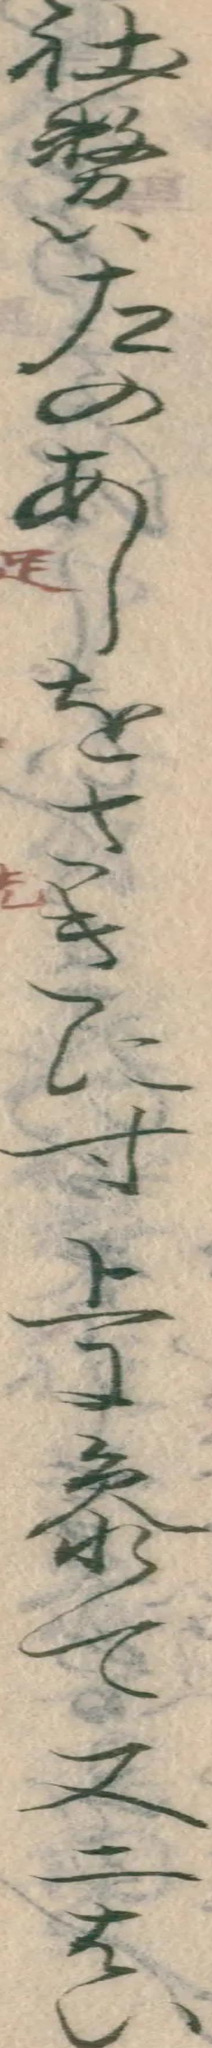社務は左のあしをさきにす上に参て又二はい
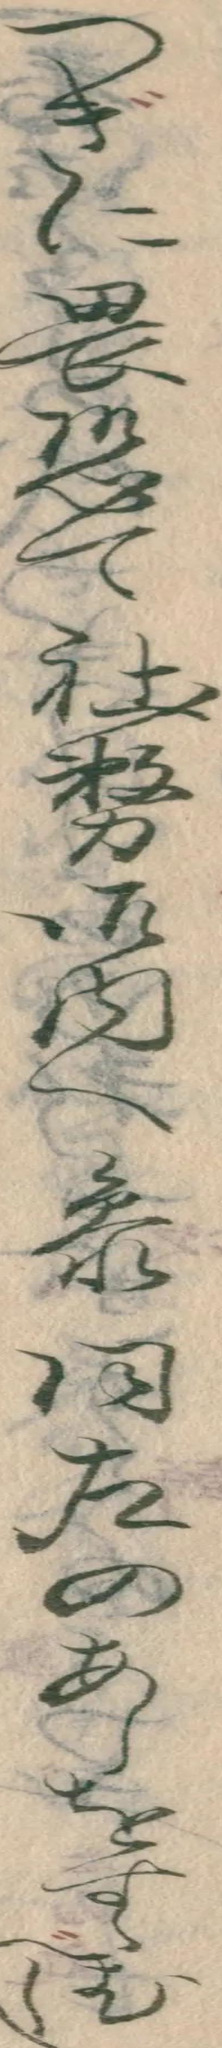つぎに畏恐て社務御内へ参同左のあしをすゝむべし
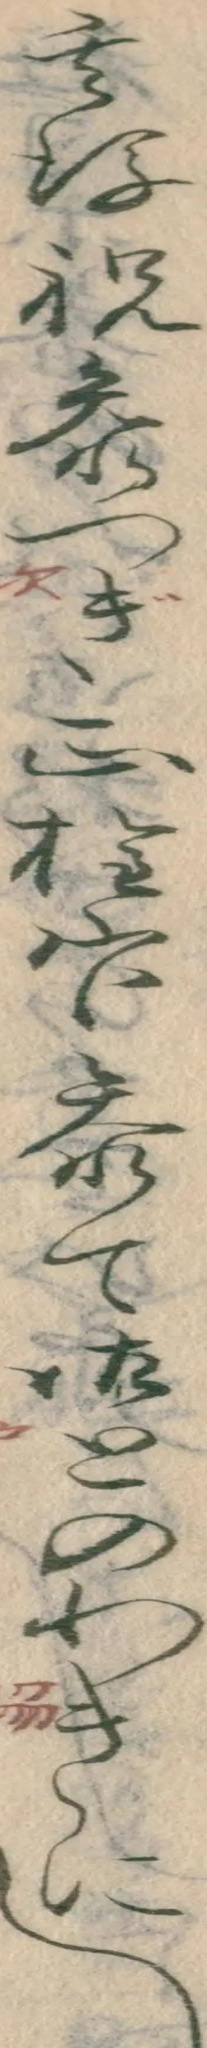其後祝参つぎ正権官参て御とのわきに
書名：賀茂社記録. 第3冊
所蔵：国立国会図書館 National Diet Library, JAPAN
